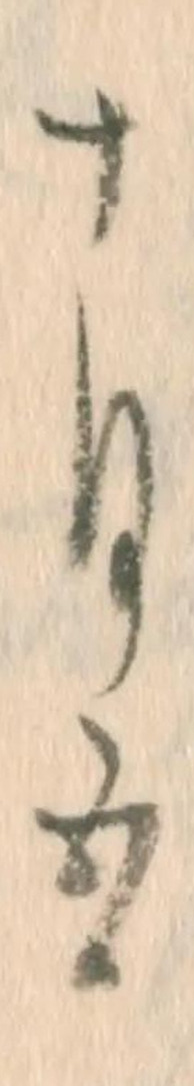十月五日

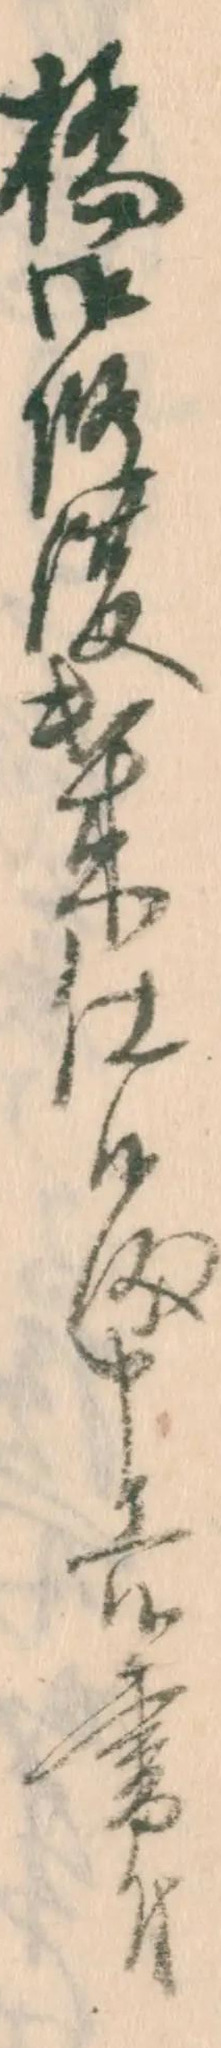橋御修復出来仕候儀申上候書付
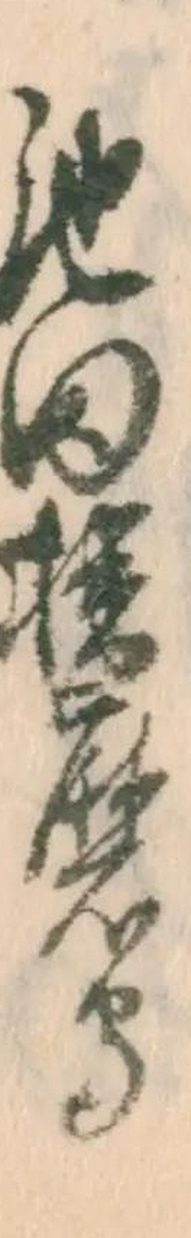御届池田播磨守
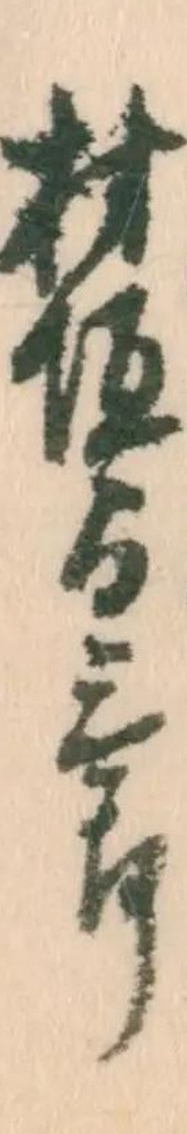村垣与三郎
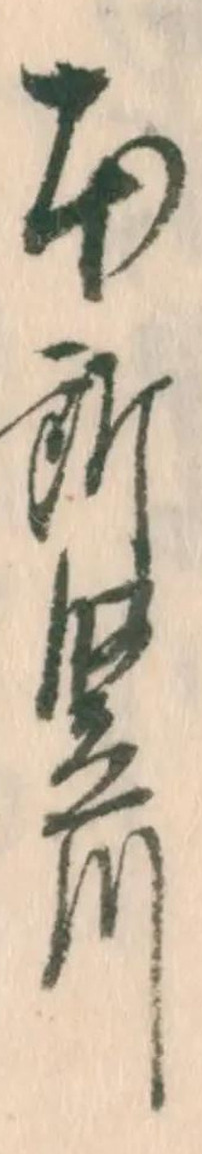本所竪川
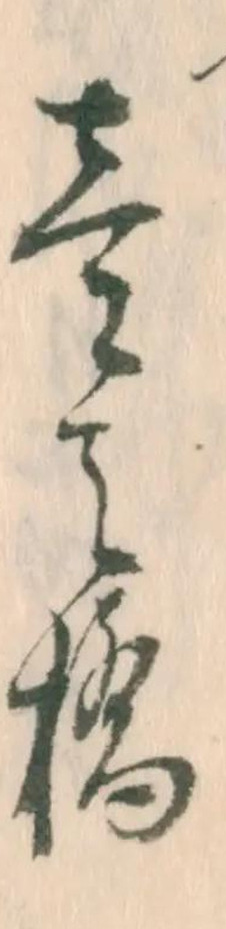壱之橋
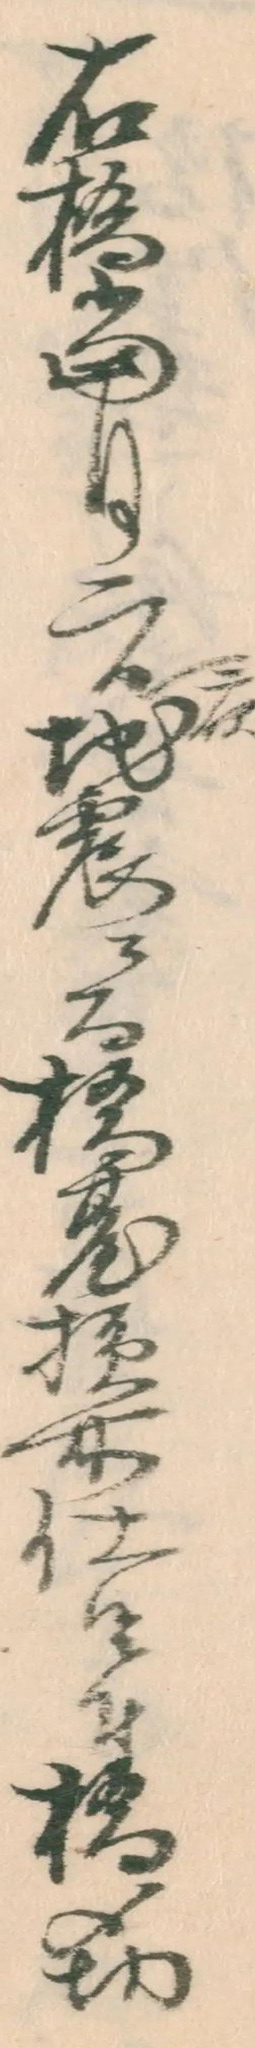右橋当月二日夜地震ニ而橋台損所仕候ニ付橋〆切
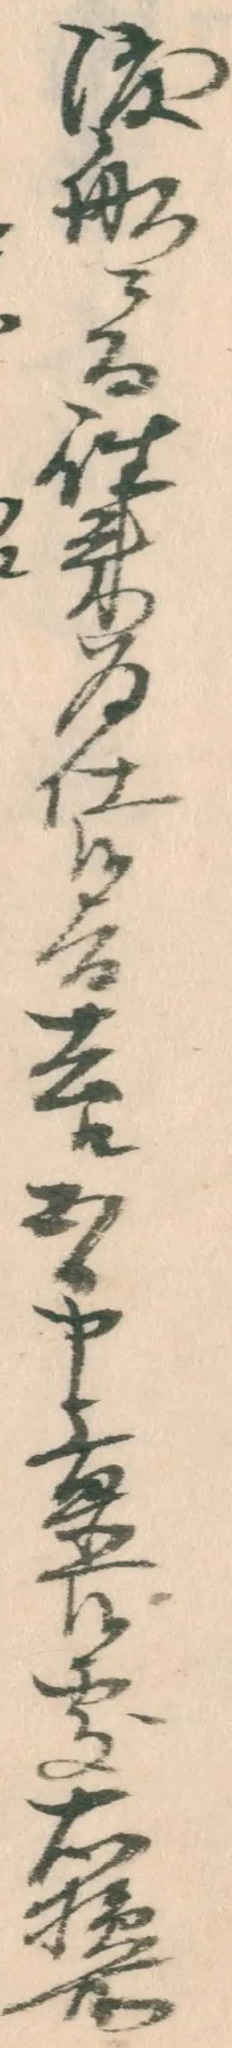渡船ニ而往来為仕候旨去ル五日申上置候処右損所
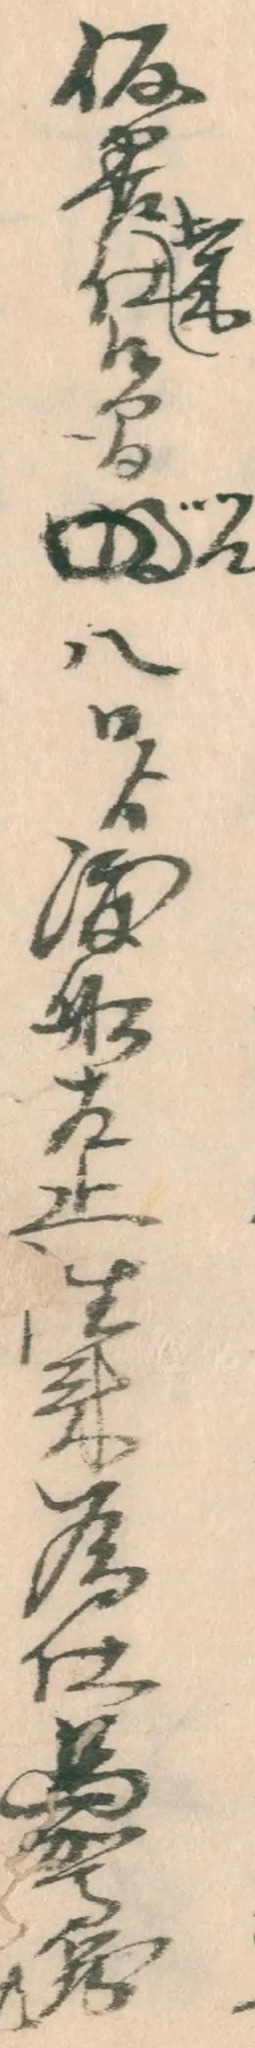仮養出来候間明八日ゟ渡船相止往来為仕馬駕籠共
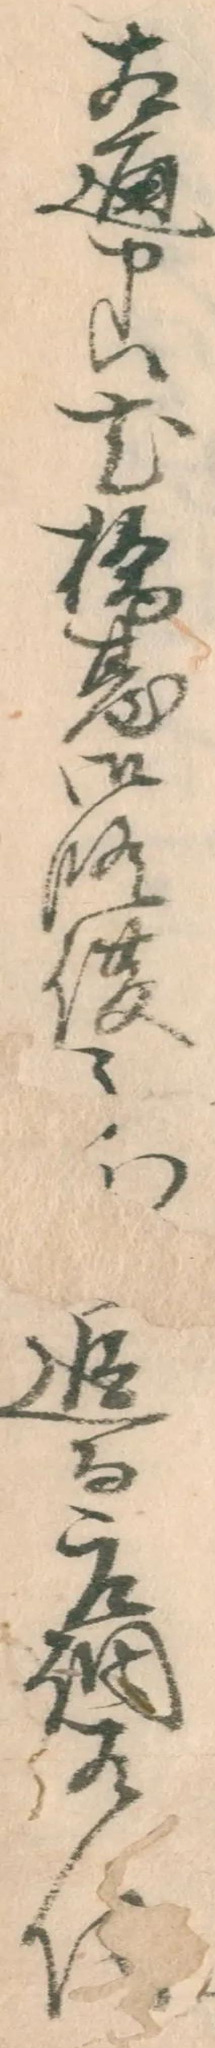相通申候尤橋台御修復之[]追而取調相伺

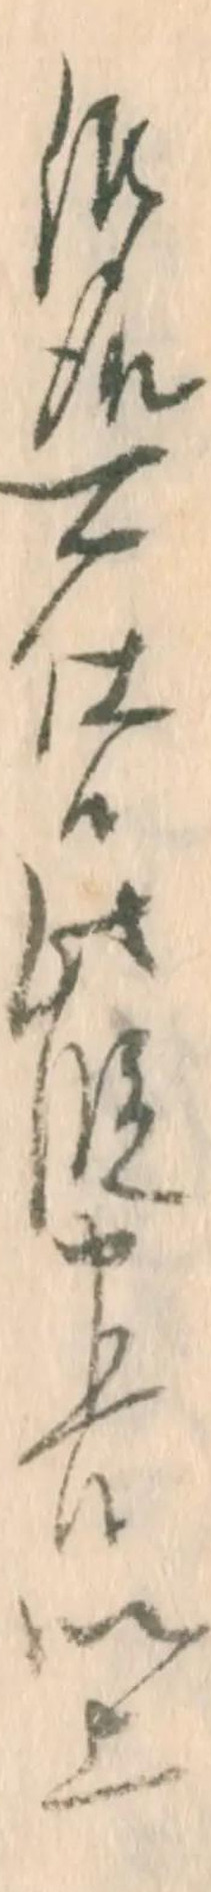候趣可仕候此段申上候以上
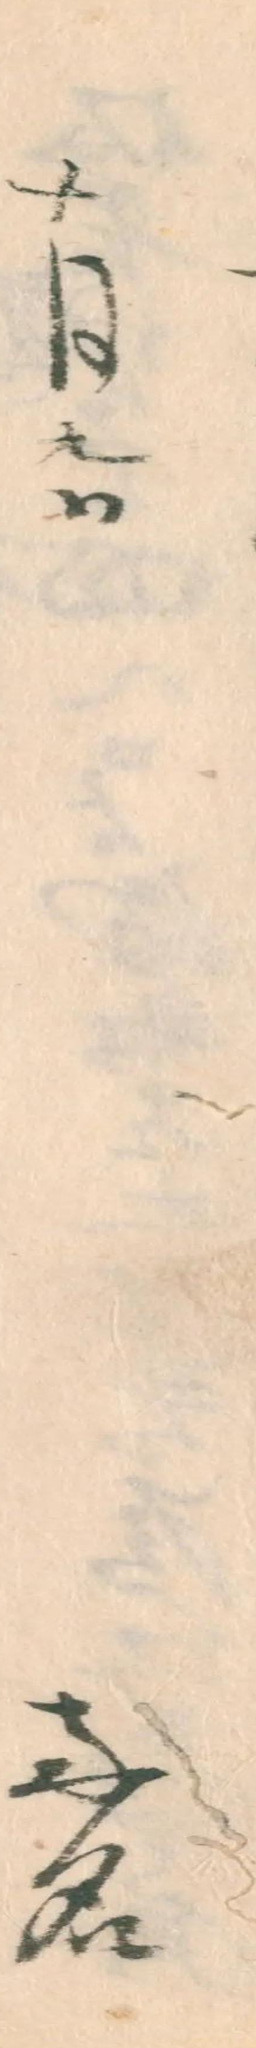十月九日両名
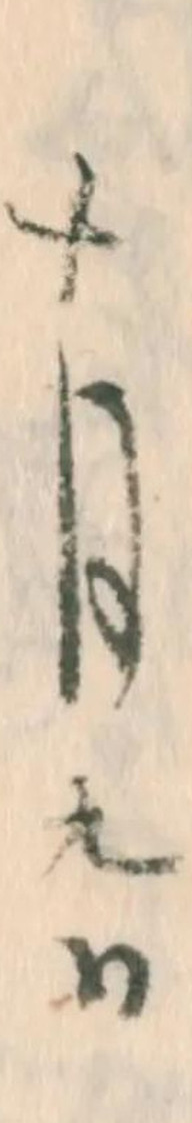十月九日
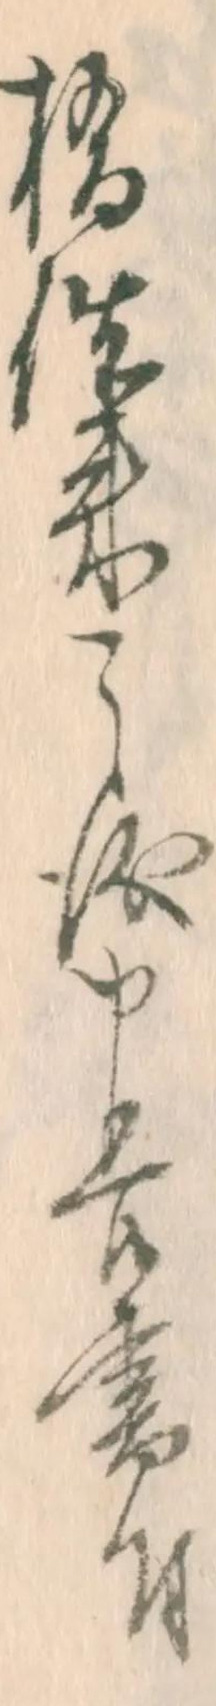橋往来之儀申上候書付
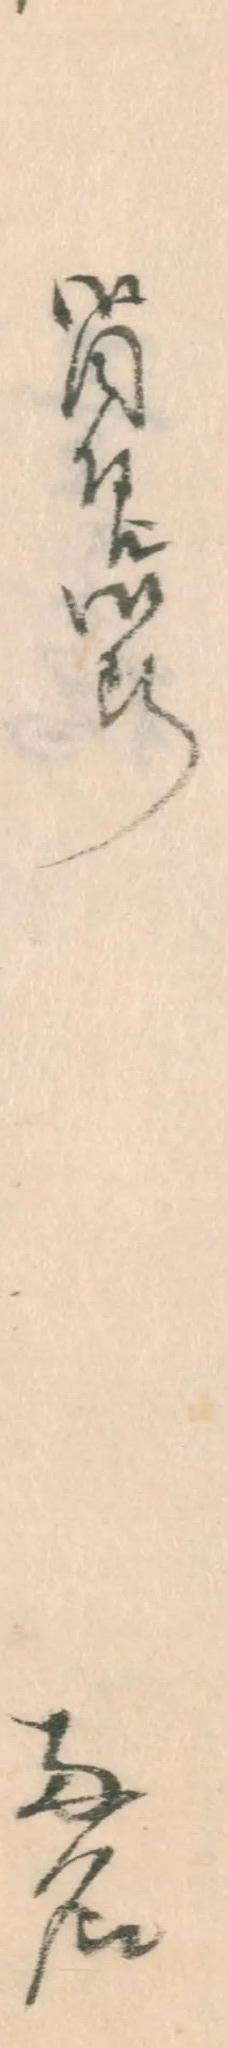御目付え御断両名
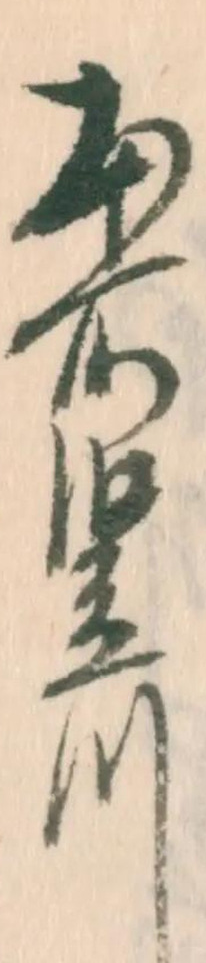本所竪川
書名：地震災書留 2巻. [1] 内表紙に「地震災書留　安政二卯年　但本所深川御用屋敷地代免除調」とあり
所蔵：国立国会図書館 National Diet Library, JAPAN
